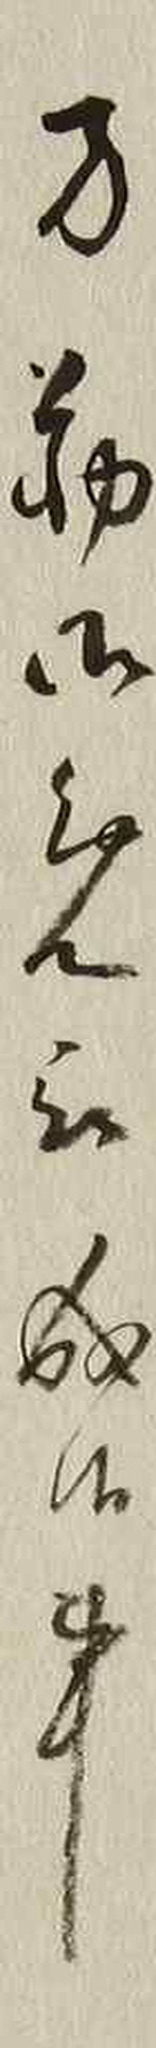方勤御免被成候事
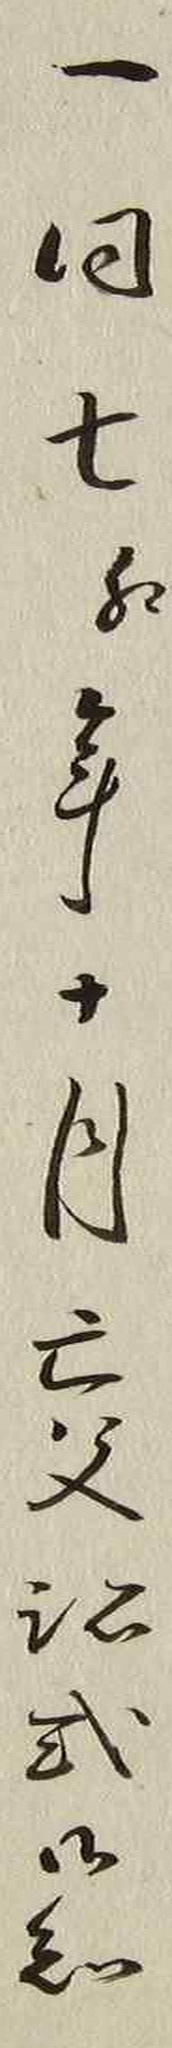一同七卯年十月亡父跡弐御知
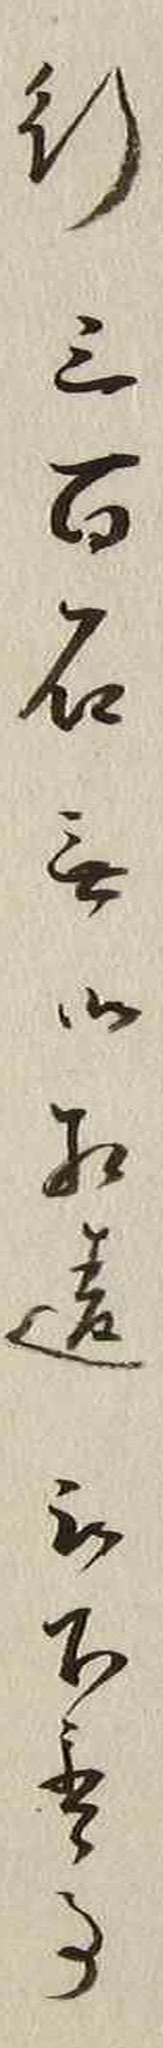行三百石無御相違被下置候事
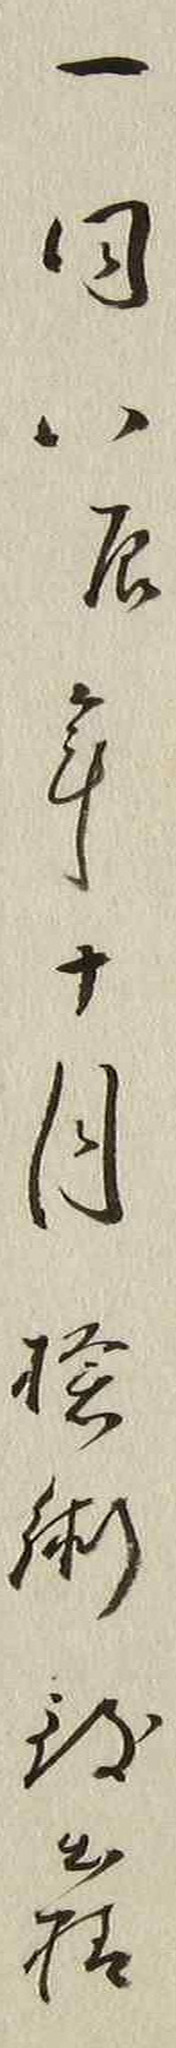一同八辰年十月槍術致出精
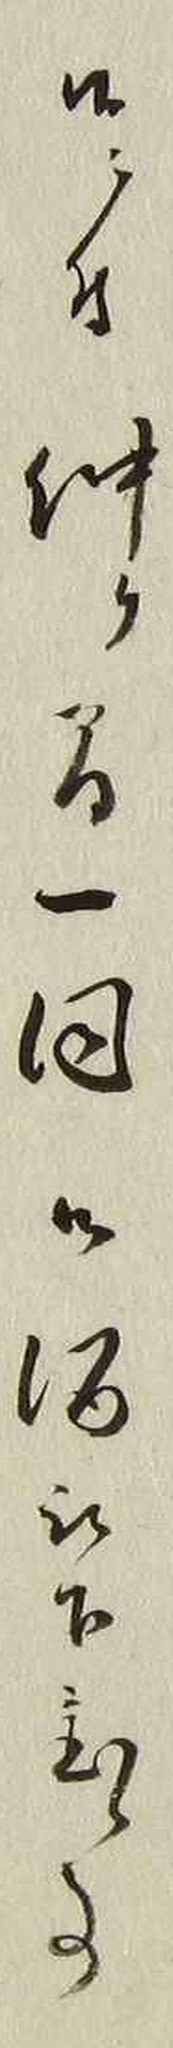候に付仲ヶ間一同御酒被下置候事
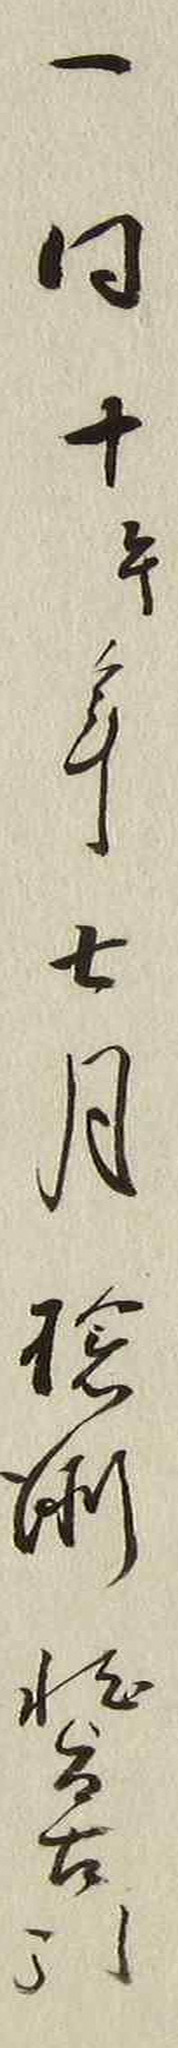一同十午年七月槍術稽古引
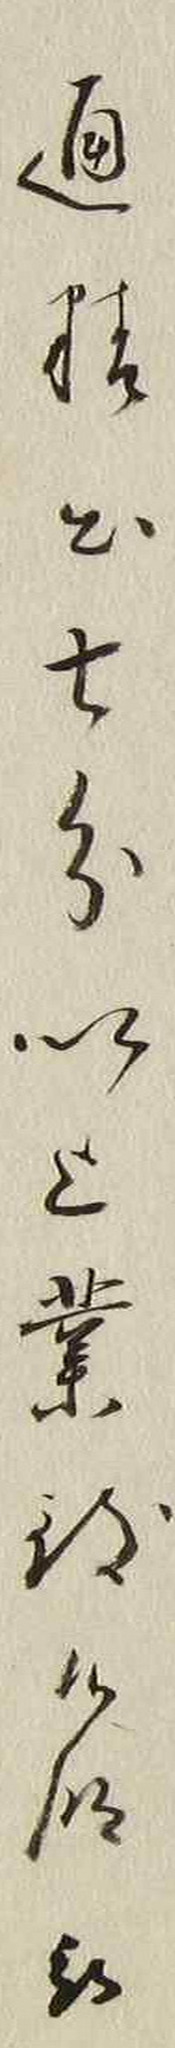通精出七分以上業致候段被
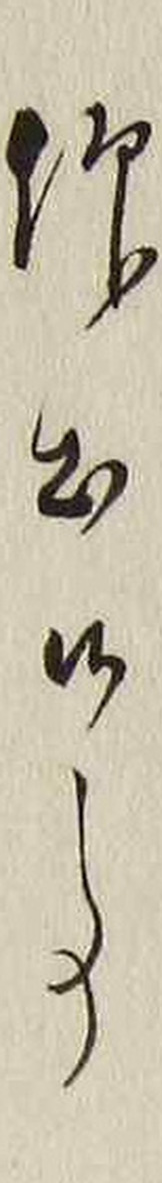仰出候事
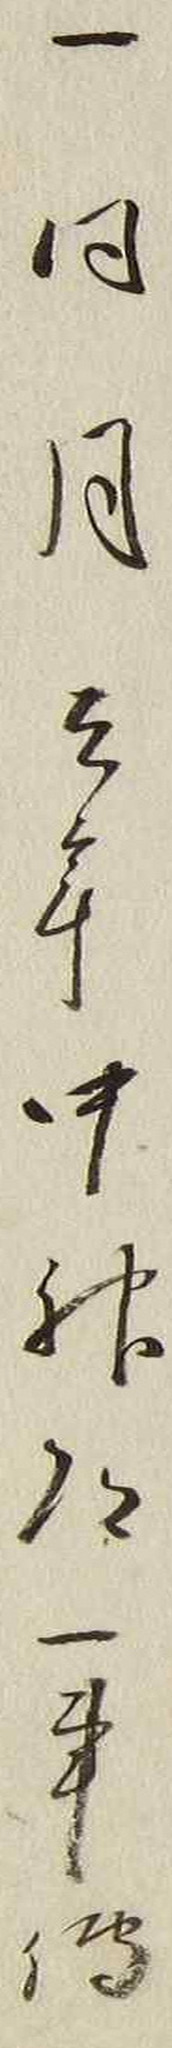一同月去年中神道一事伝
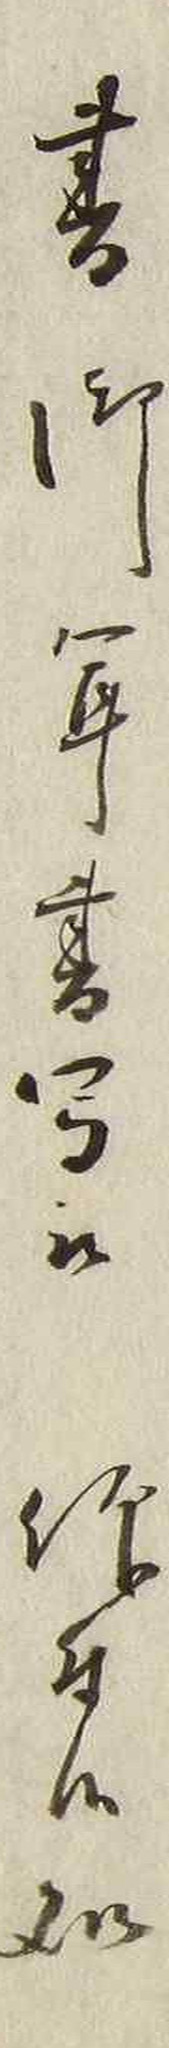書御軍書写被仰付候処

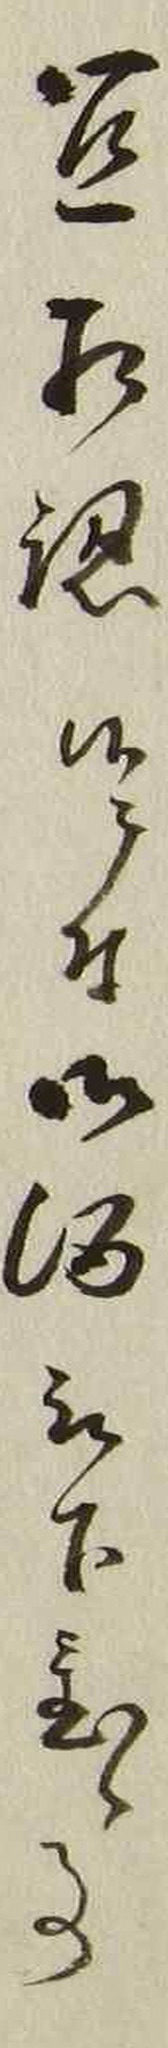宜相認候に付御酒被下置候事
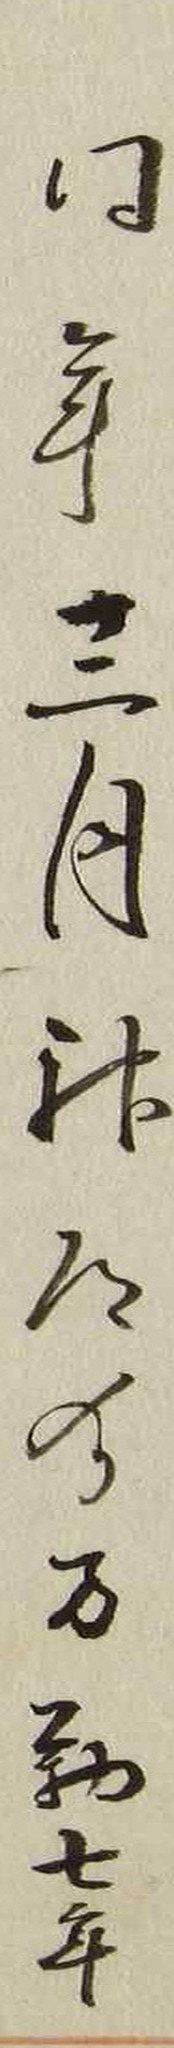一同年十二月神道〆り方勤七年
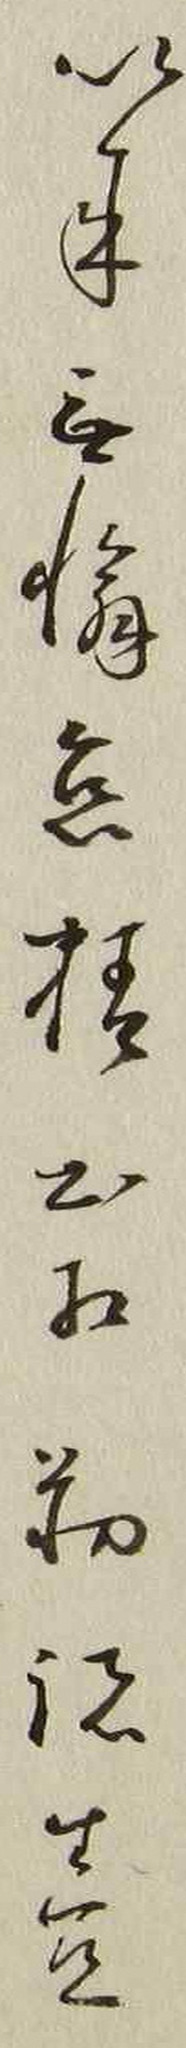以來無懈怠精出相勤諸生宜
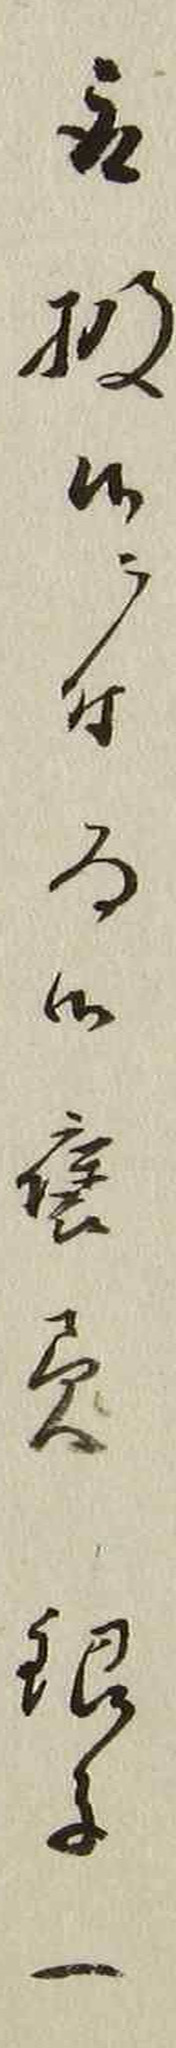取扱候に付為御褒美銀子一
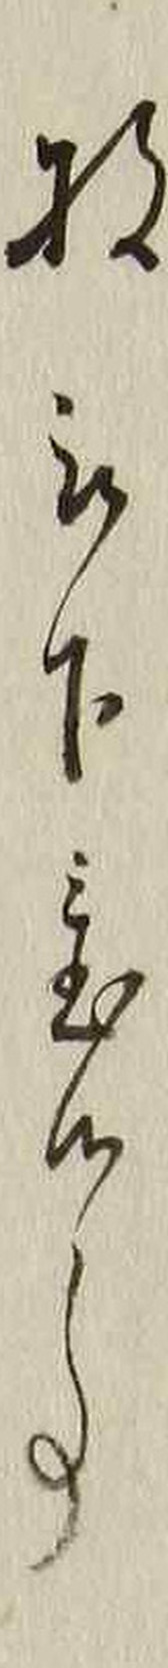枚被下置候事
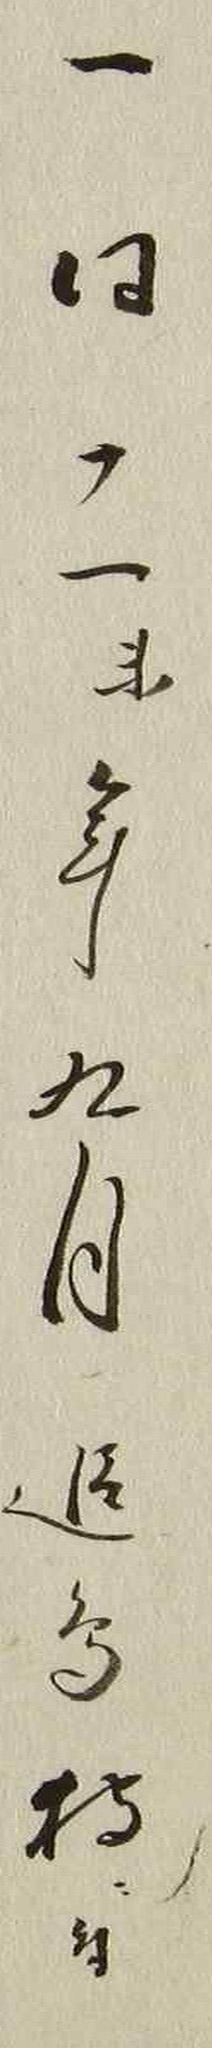一同十一未年九月追鳥狩に付
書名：諸士系譜　巻之159　な之部1
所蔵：会津若松市立会津図書館
